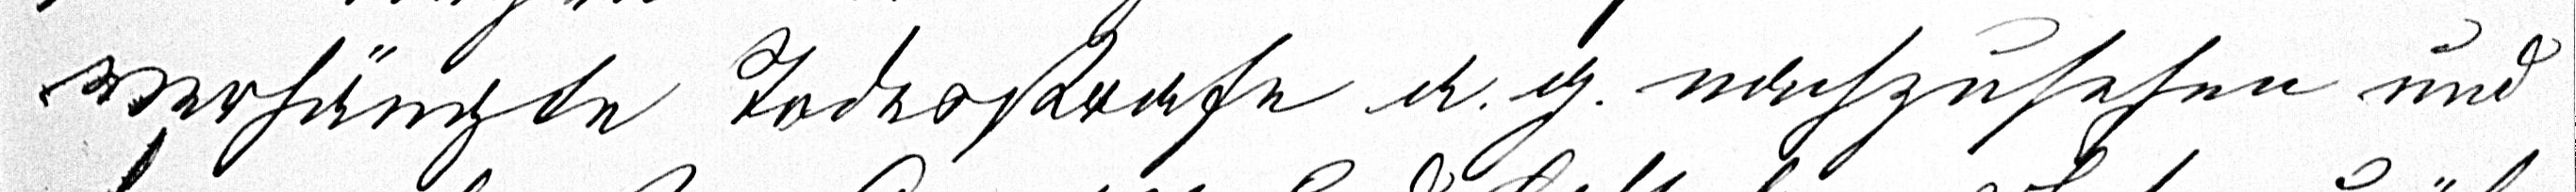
verhängte Todesstrafe a. g. nachzusehen und
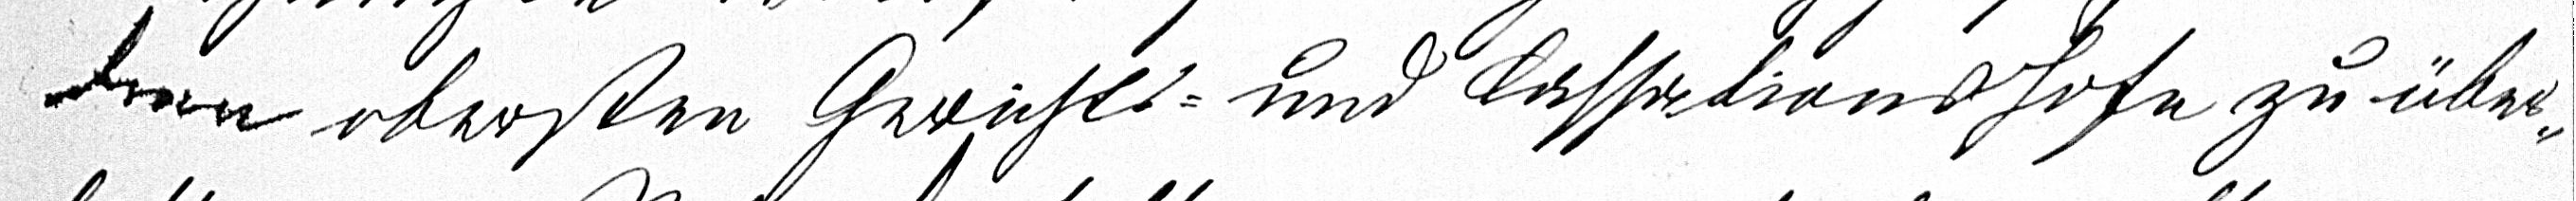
dem obersten Gerichts= und Cassationshofe zu über¬
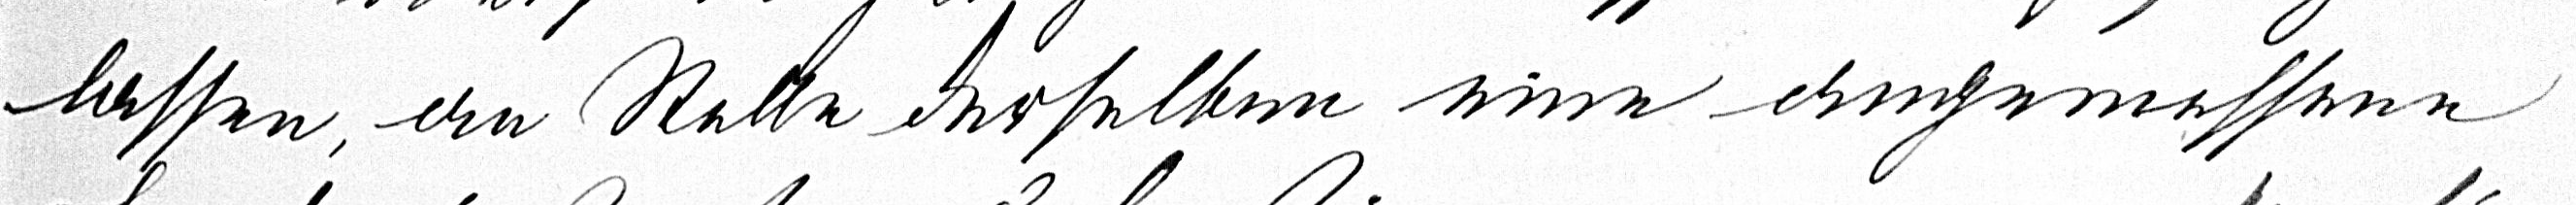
lassen, an stelle derselben eine angemessene
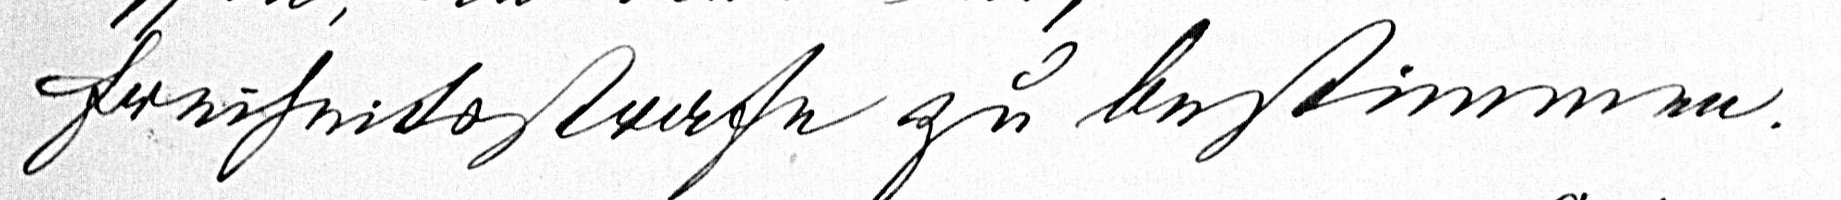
Freiheitstrafe zu bestimmen.
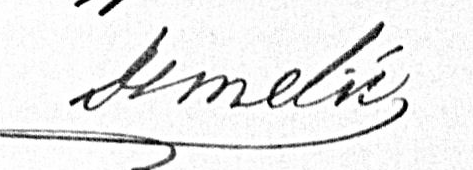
Stmelic
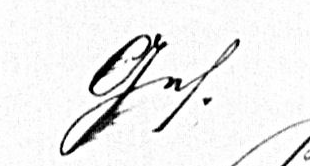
Ges.
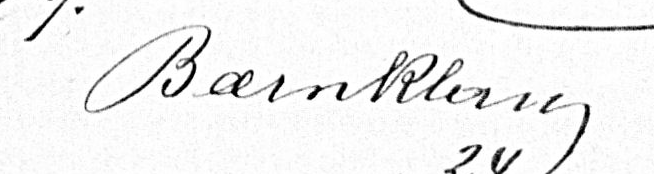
Barnklan
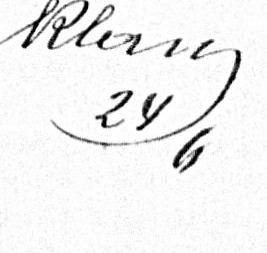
24/6
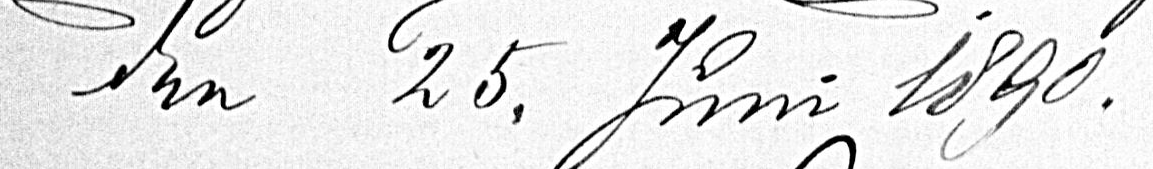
den 25. Juni 1890.
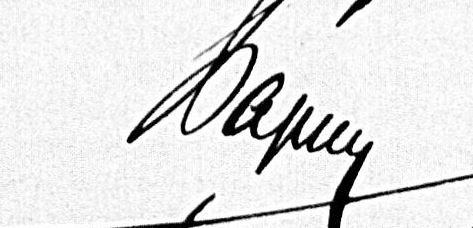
Káxx
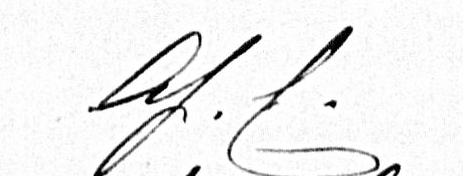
Af. E.
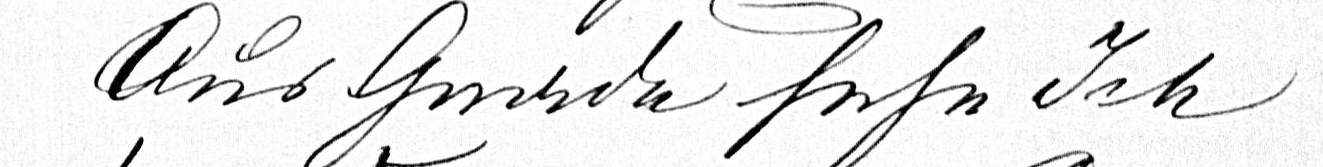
Aus Gnade sehe Ich
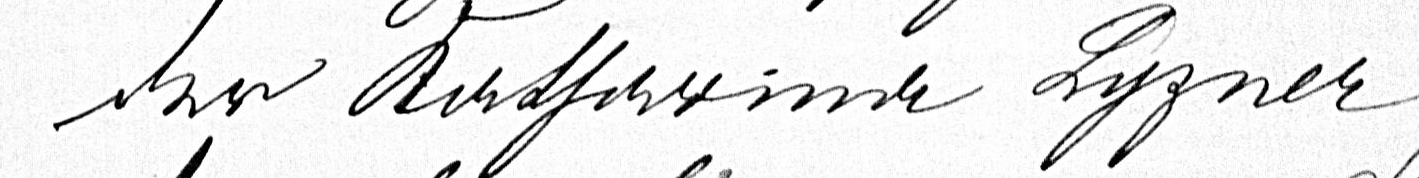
der Katharina Lyzner
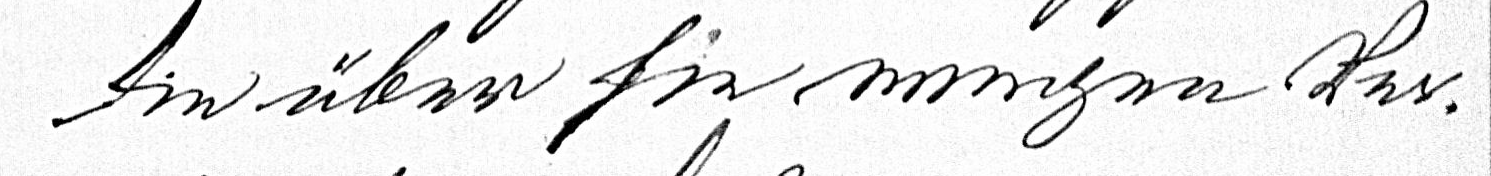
die über sie wegen Ver¬
